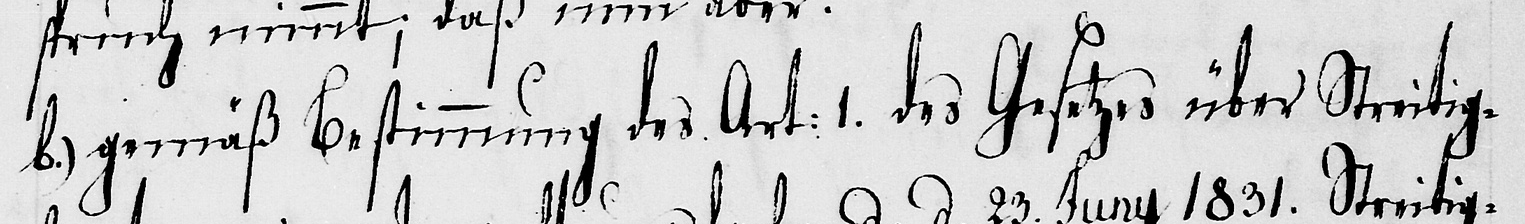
b.) gemäß Bestimmung des Art: 1 des Gesetzes über Streitig¬
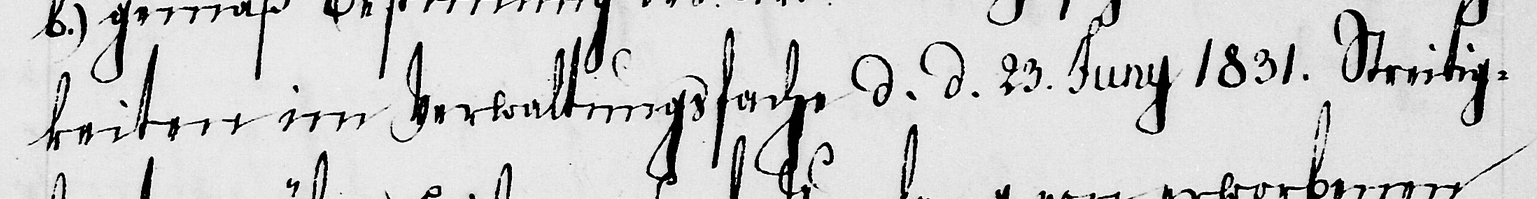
keiten im Verwaltungsfache d. d. 23. Juny 1831. Streitig¬
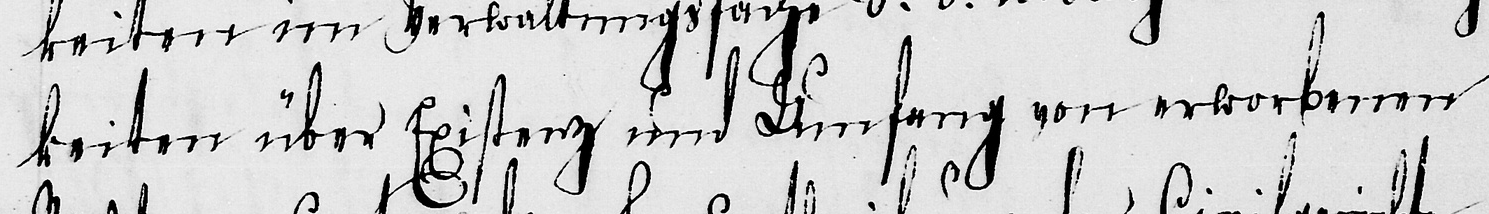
keiten über Existenz und Umfang von erworbenen
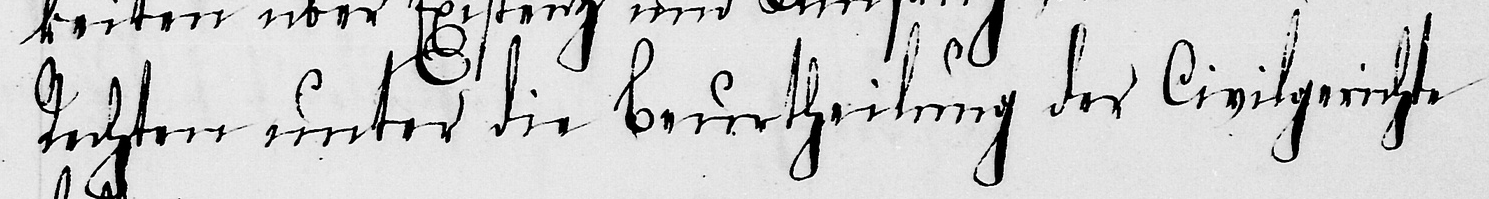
Rechten unter die Beurtheilung der Civilgerichte
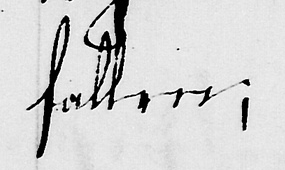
fallen;
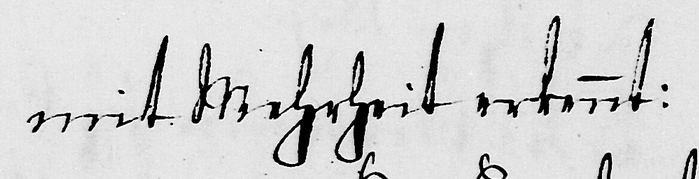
mit Mehrheit erkennt:
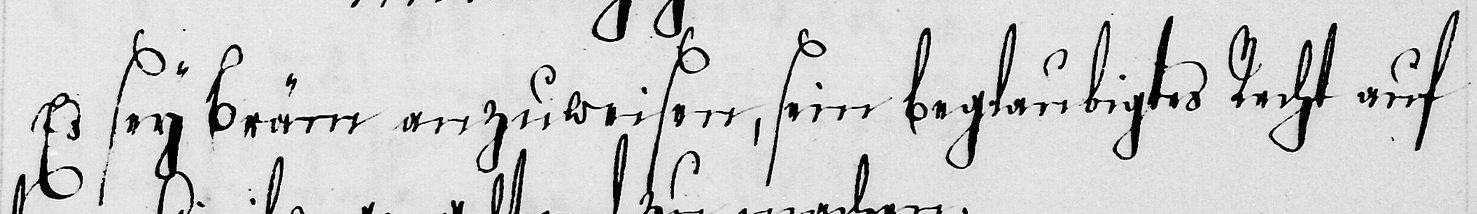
Es sey Bräm anzuweisen, sein beglaubigtes Recht auf
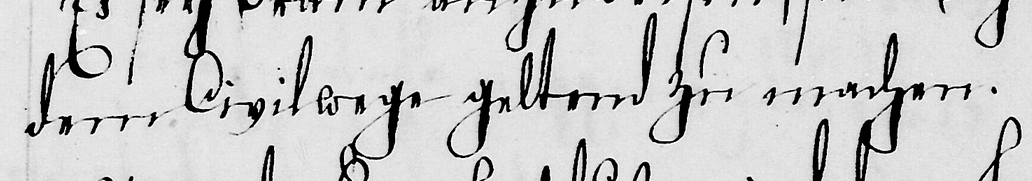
dem Civilwege geltend zu machen.
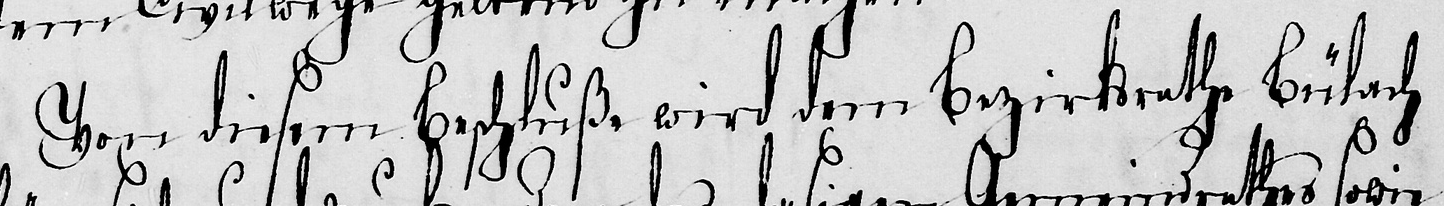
Von diesem Beschluße wird dem Bezirksrathe Bülach
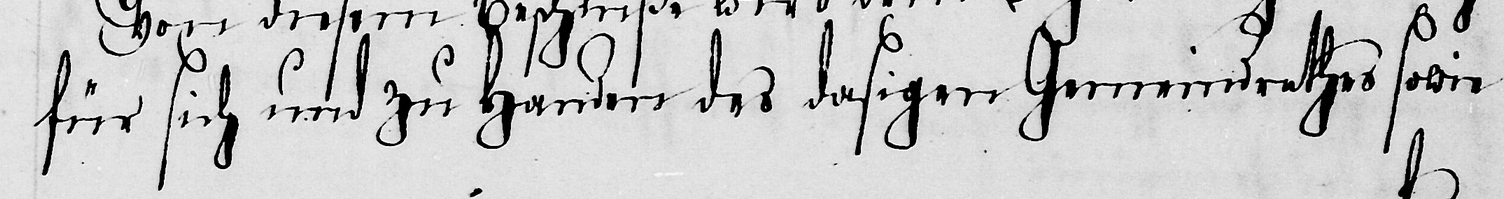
für sich und zu Handen des dasigen Gemeindrathes sowie
